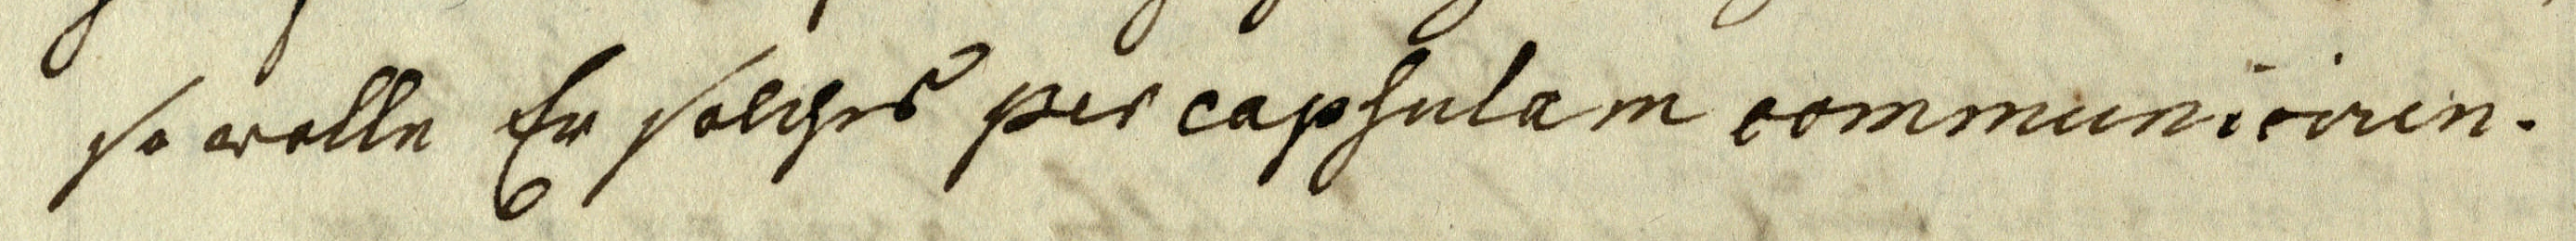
so wolle Er solches per capsulam communiciren.
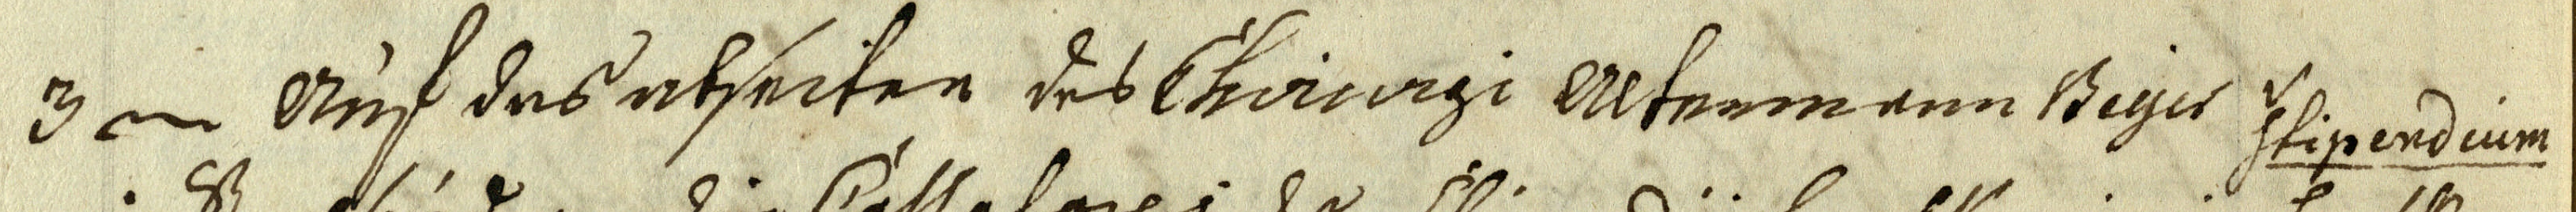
3. Auf das abseiten des Chirurgi Altermann Beÿer Stipendium
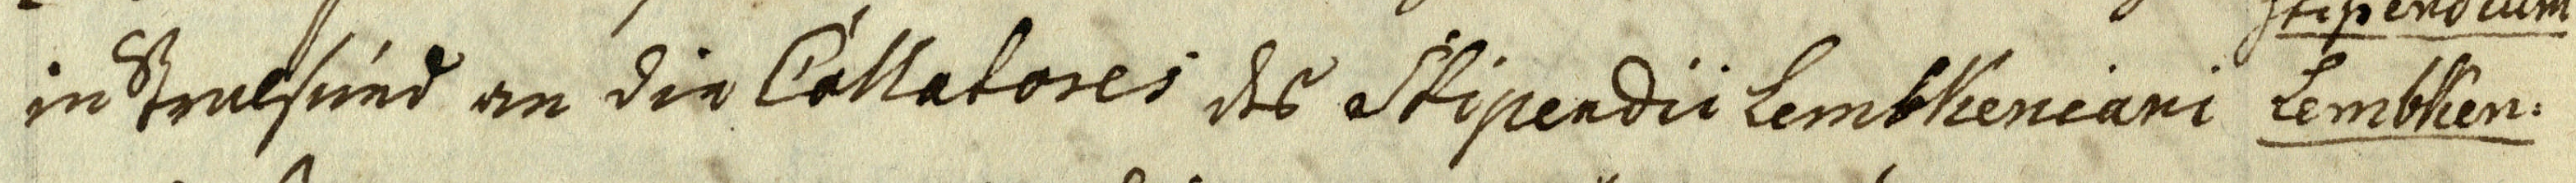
in Stralsund an die Collatores des Stipendii Lembkeniani Lembken
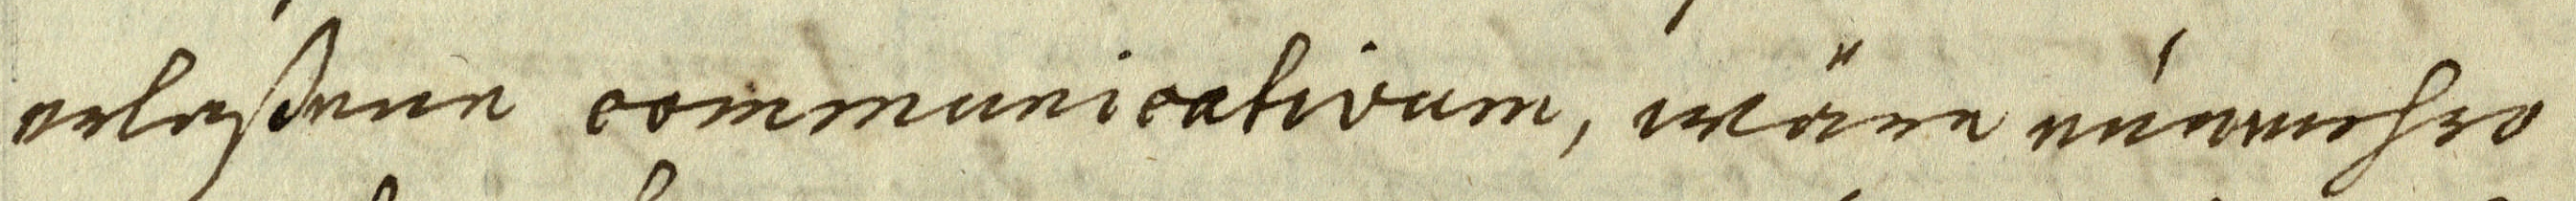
erlaßenen communicativum, währe nunmehro
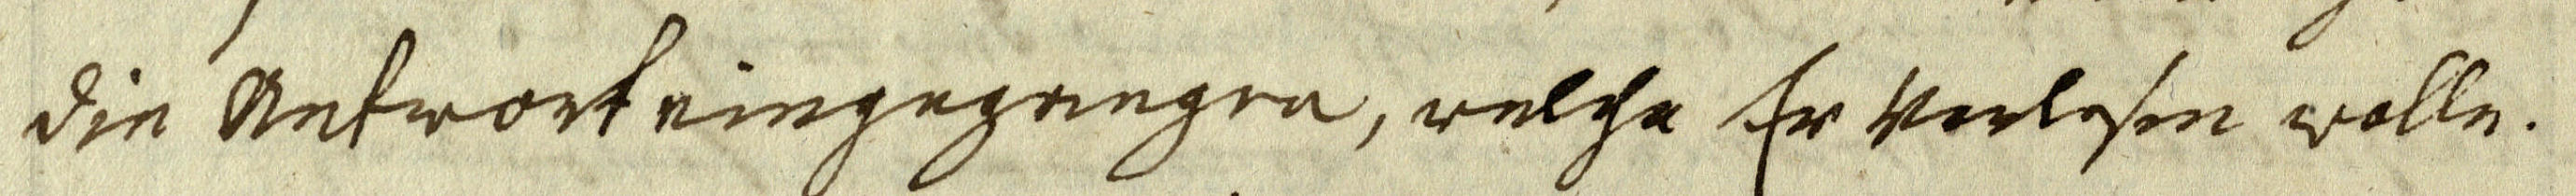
die Antwort eingegangen, welche Er verlesen wolle.
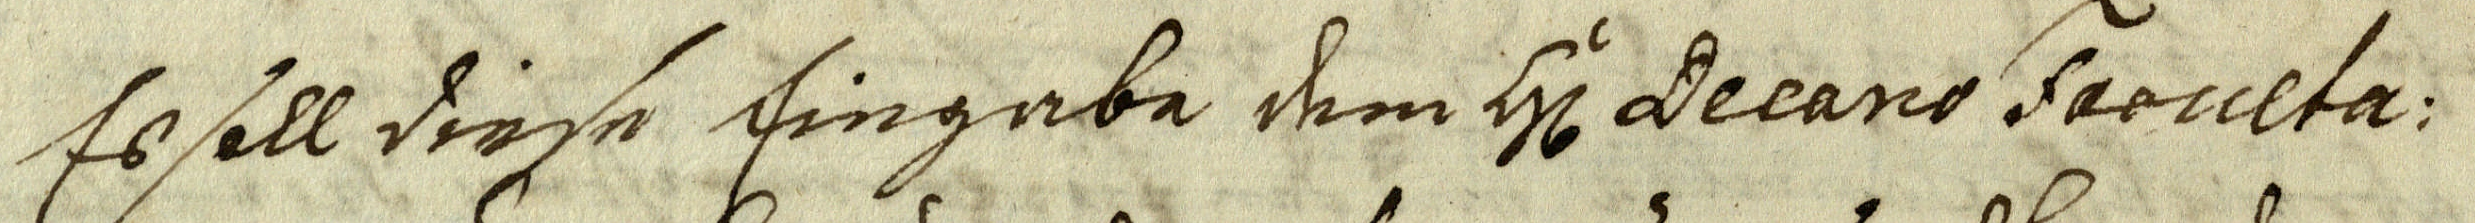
es soll diese Eingabe dem H. Decano Faculta¬
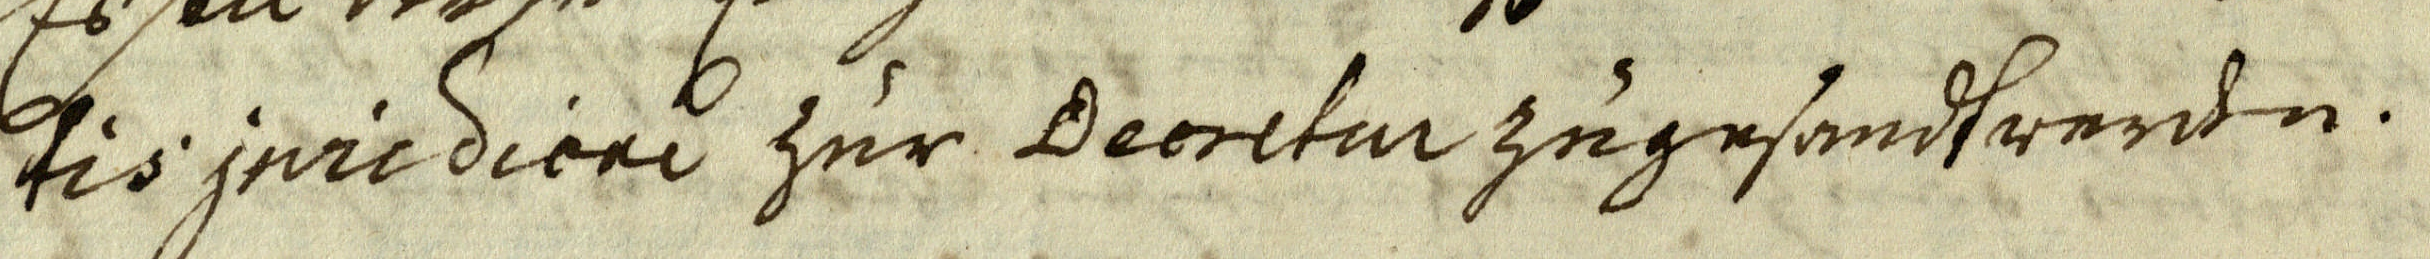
tis juridicae zur Decretur zugesandt werden.
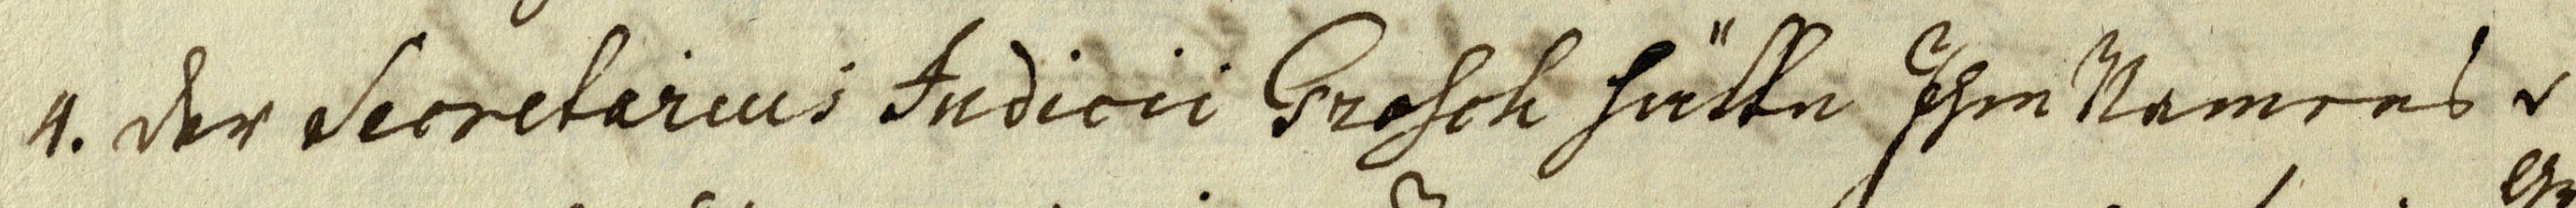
4. Der Secretarius Judicii Grosch hätte Ihm Namens
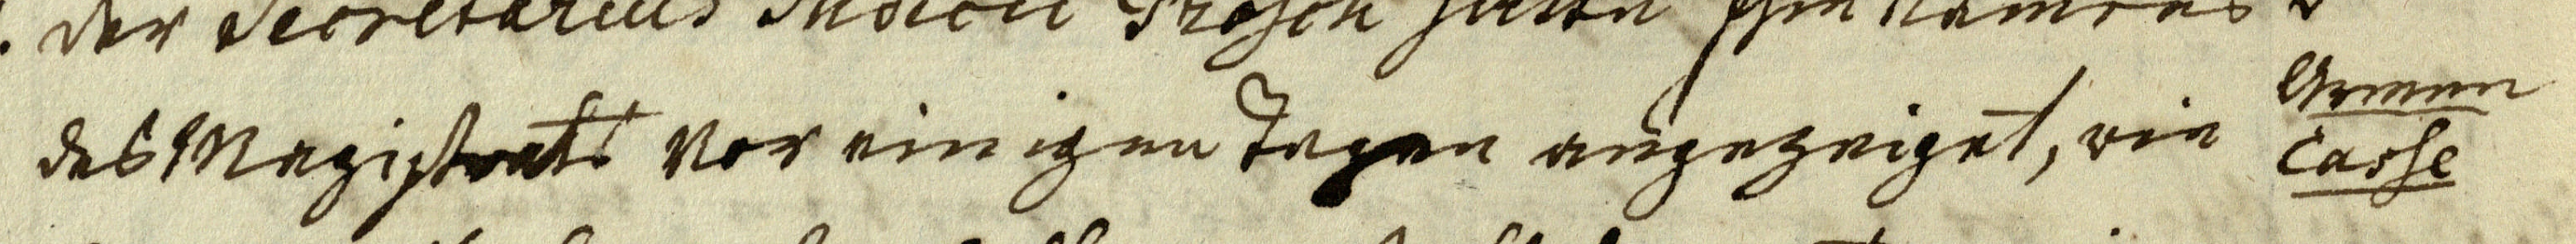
des Magistrats vor einigen Tagen angezeiget, wie Armen
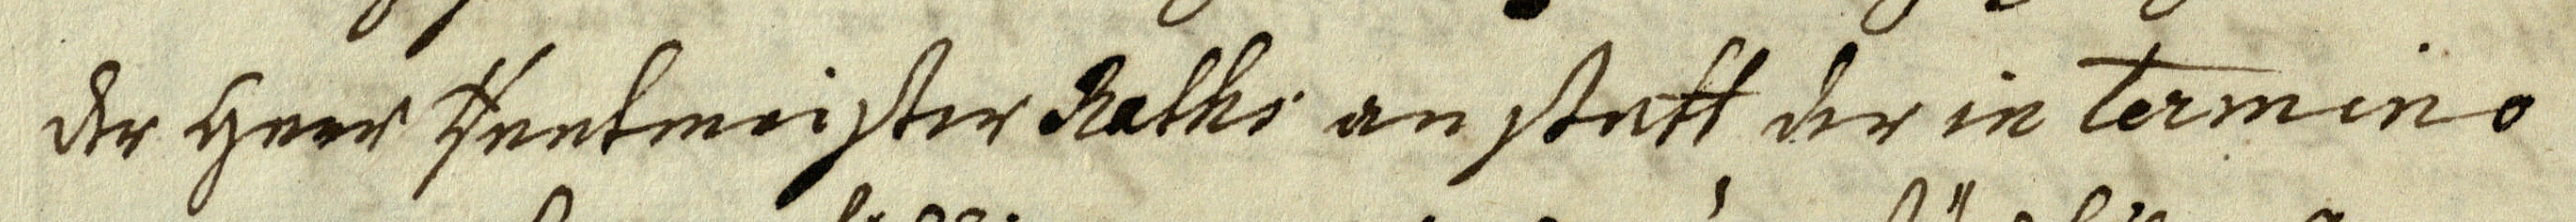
der Herr Rentmeister Raths anstatt der in termino
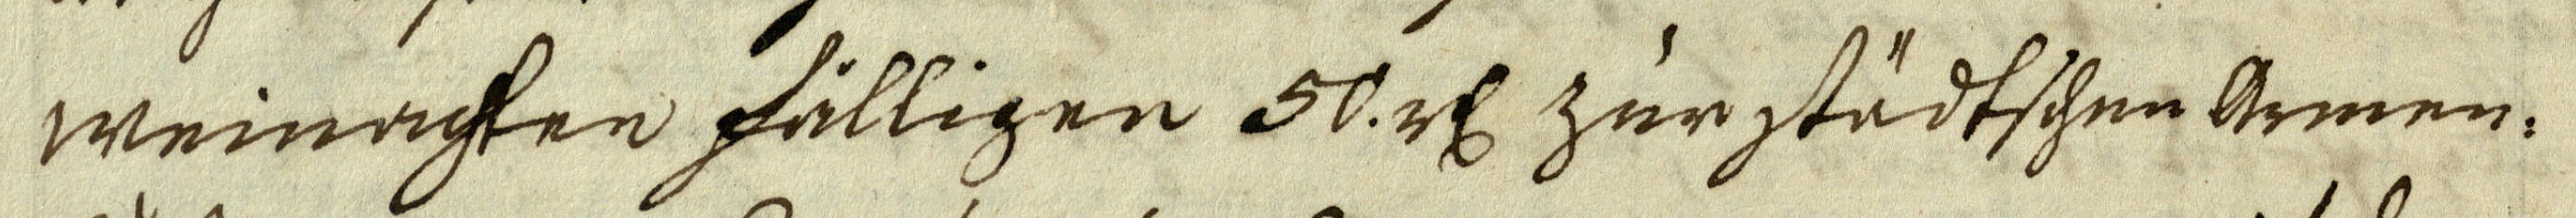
Weinachten fälligen 50. r. zur städtischen Armen¬
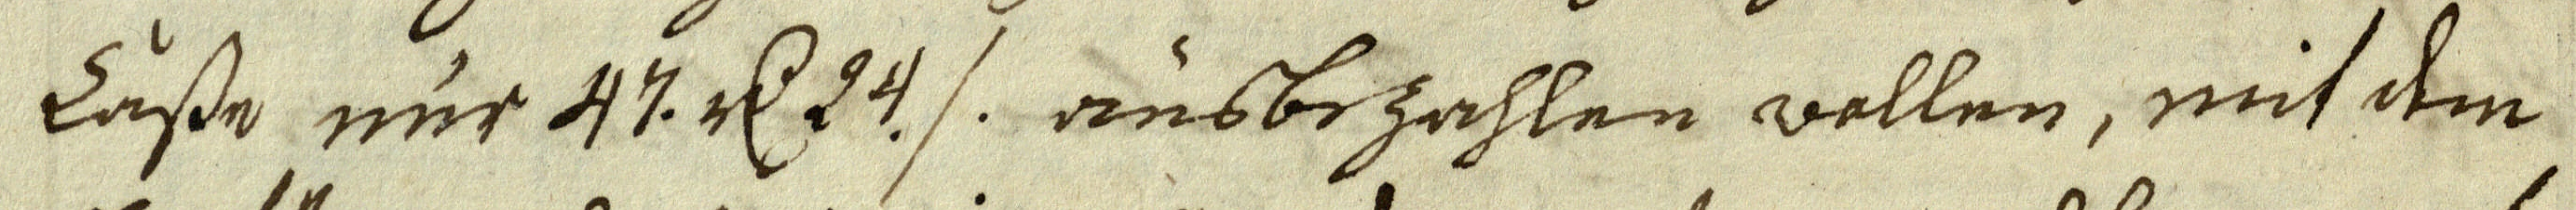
caße nur 47. r. 24. s. ausbezahlen wollen, mit dem
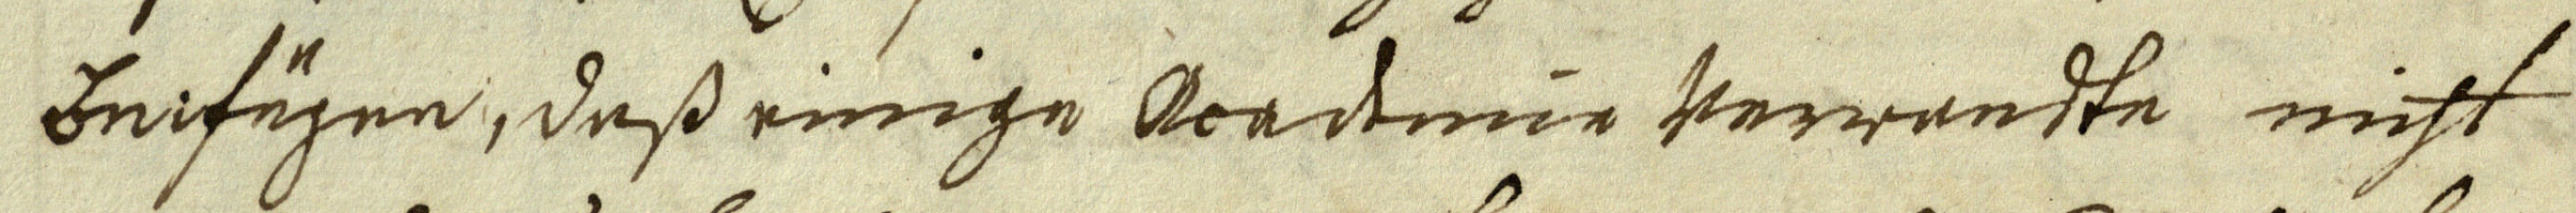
Beifügen, daß einige Academie Verwandte nicht
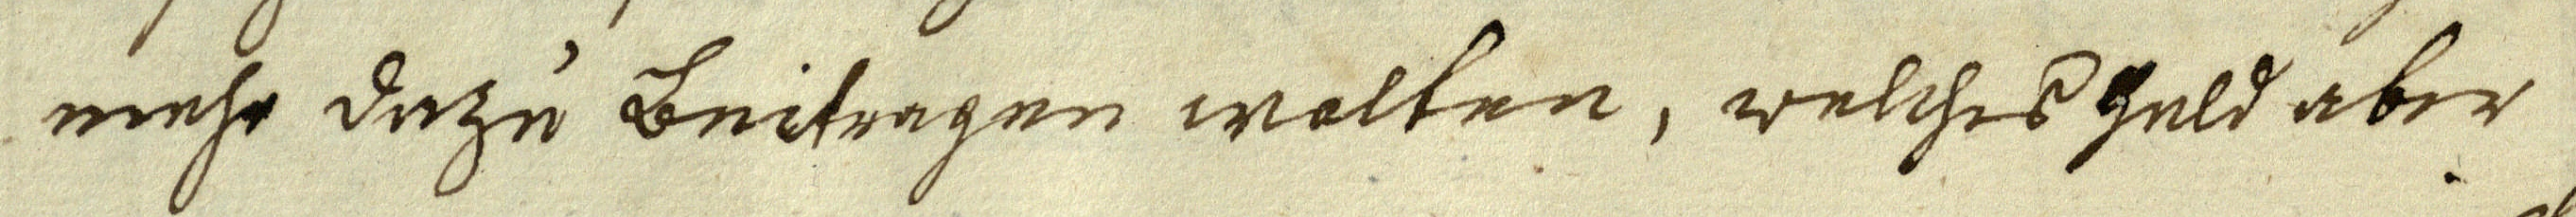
mehr dazu beitragen wolten, welches Geld aber
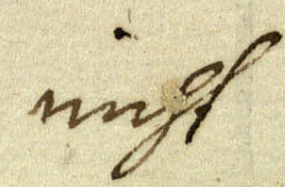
nicht
